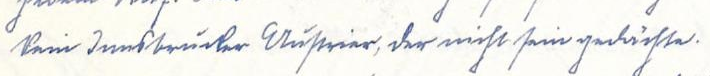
keine Innsbrucker Austrier, der nicht sein gedächte.
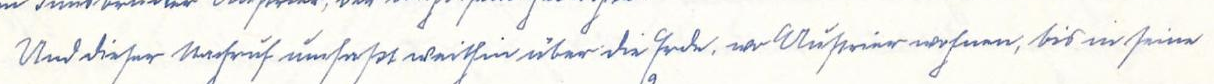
Und dieser Nachruf umfasst weithin über die Erde, wo Autrier wohnen, bis in seine
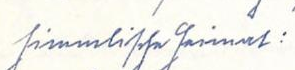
himmlische Heimat:
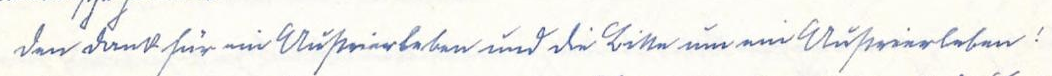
Den Dank für ein Austrierleben und die Bitte um ein Austrierleben!
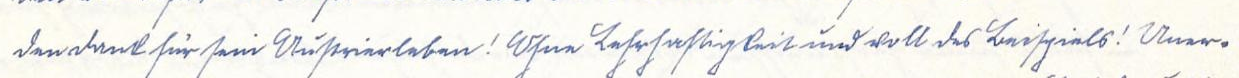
Den Dank für sein Austrierleben! Ohne Lehrhaftigkeit und voll des Beispiels! Uner-
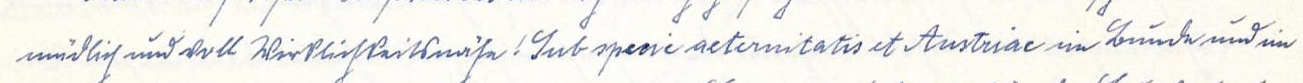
müdlich und voll Wirklichkeitsnähe! Sub specie aeternitatis et Austriae im Bunde und im
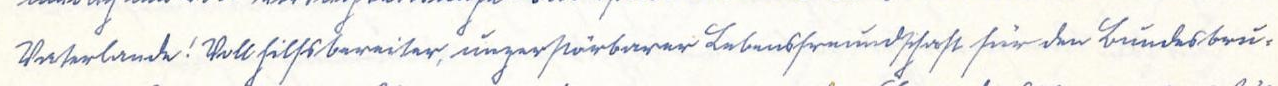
Vaterlande! Voll hilfsbereiter, unzerstörbarer Lebensfreundschaft für den Bundesbru-
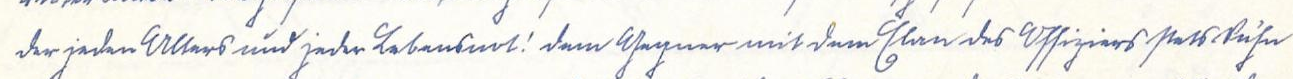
der jeden Alters und jeder Lebensnot! Dem Gegner mit dem Elan des Offiziers stets kühn
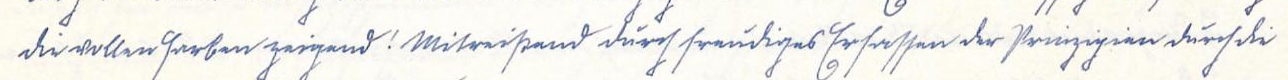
die vollen Farben zeigend. Mitreißend durch freudiges Erfassen der Prinzipien durch die
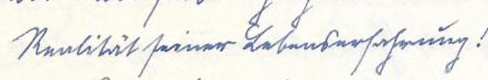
Realität seiner Lebenserfahrung!
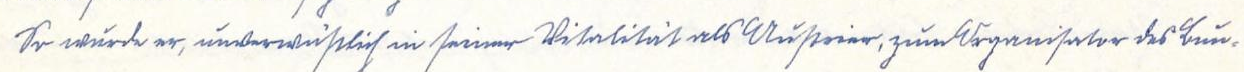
So wurde er, unverwüstlich in seiner Vitalität als Austrier zum Organisator des Bun-
